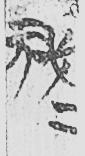戍=
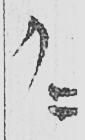人=
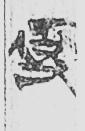史
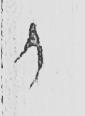人
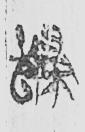{𡴎帚}（歸）
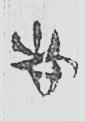告
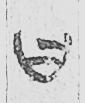曰
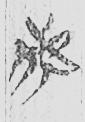我
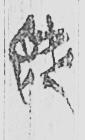既
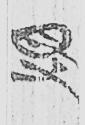𠭁
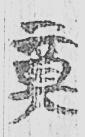奠
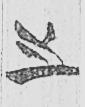之
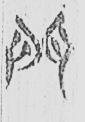門
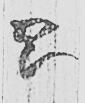也
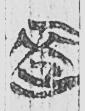麥
